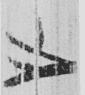之
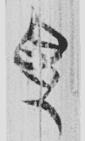見
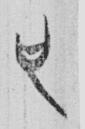也
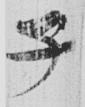子
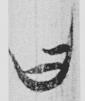曰
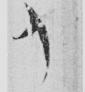人
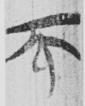而
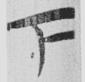下
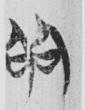臨
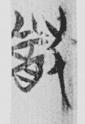猶（猶）
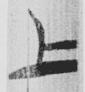上
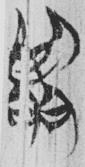臨
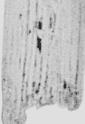也
